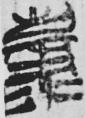鹿
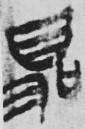鳴
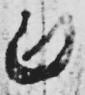㠯（以）
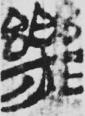樂
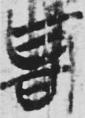○（臺）
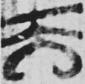而
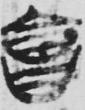會
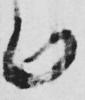㠯（以）
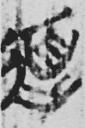道
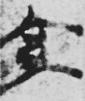交
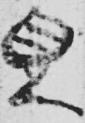見
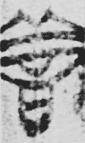善
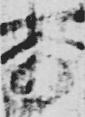而
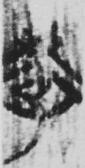○（學）
